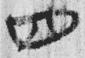四
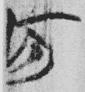戶
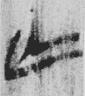亡（无）
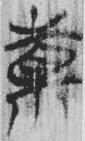○（眚）
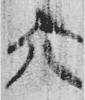六
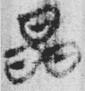晶（三）
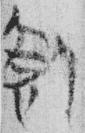飤（食）
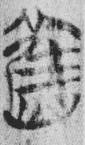舊
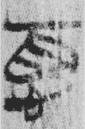惪（德）
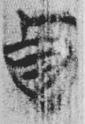貞
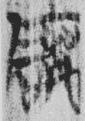○（厲）
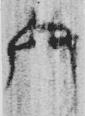夂（終）
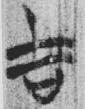吉
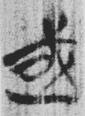或
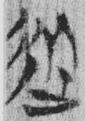從
